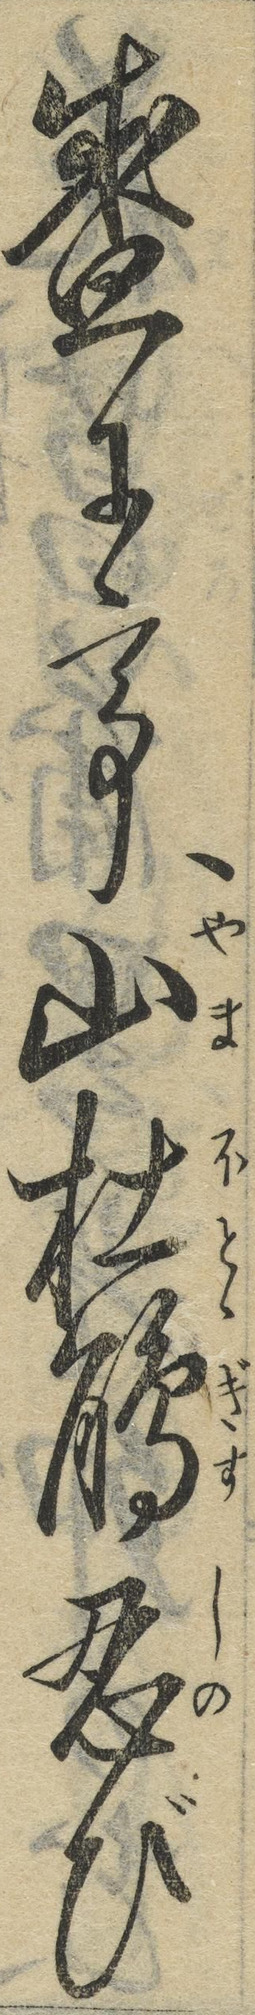盛にて、山杜鵑忍び
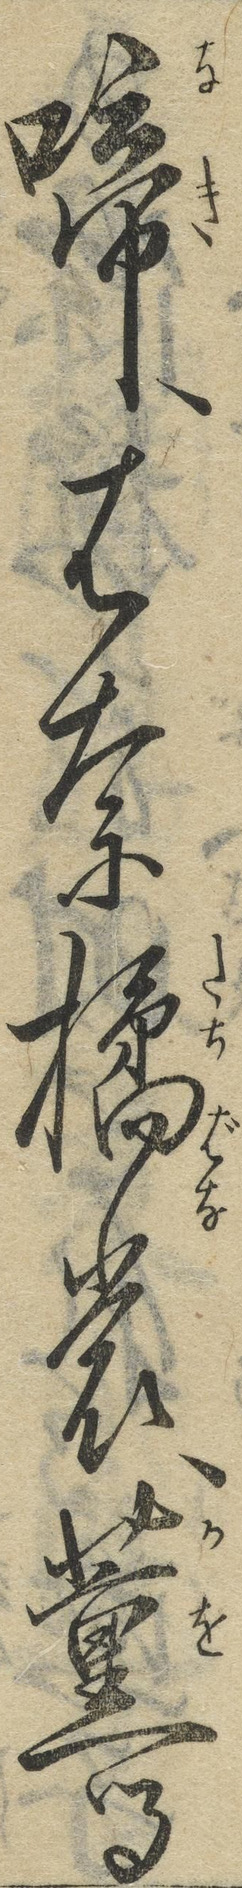啼、はな橘も、薫る
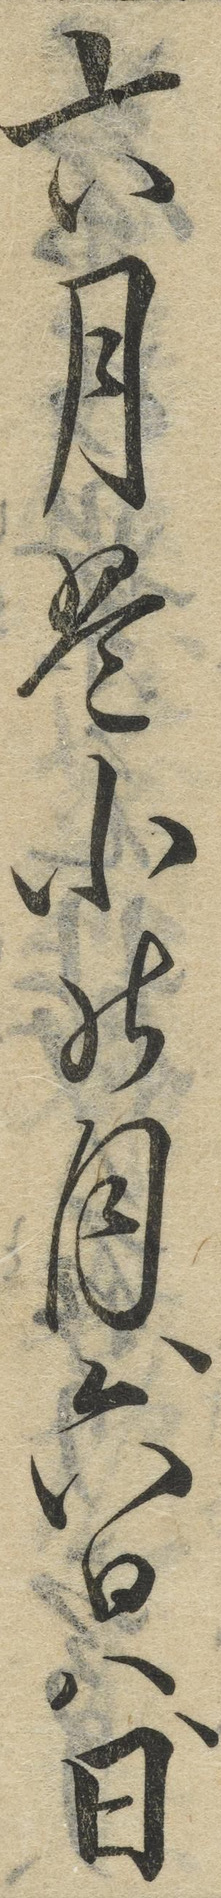六月は小の月、六日は、日
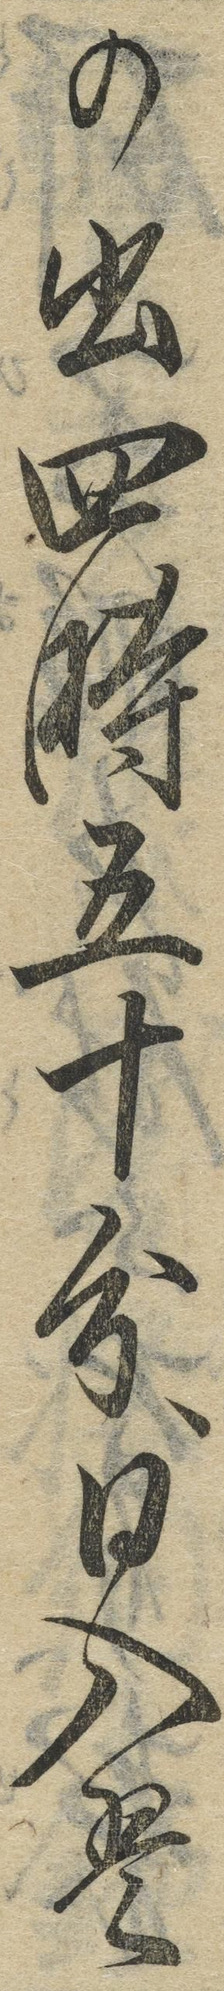の出四時五十分、日入は
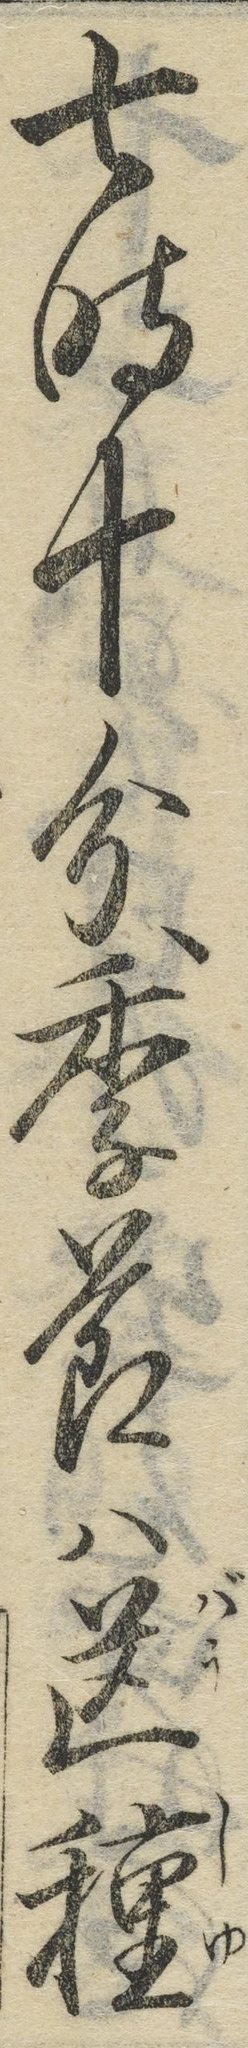七時十分、季節は芒種
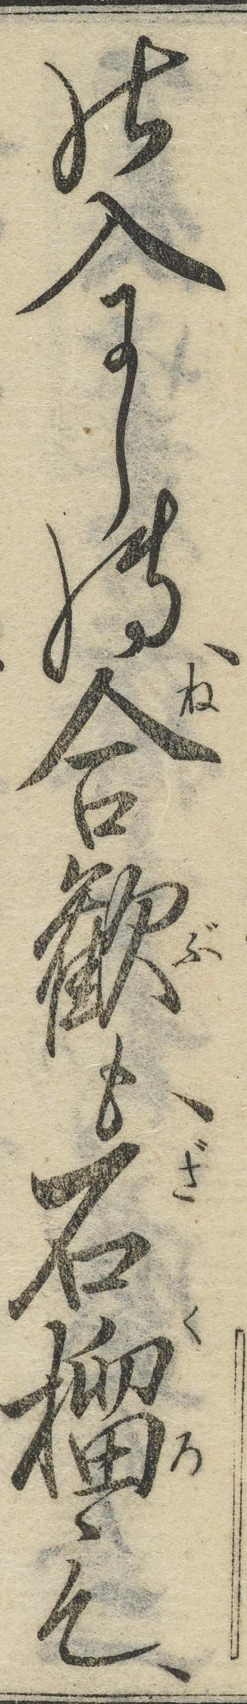の入にして、合歓も、石榴も、
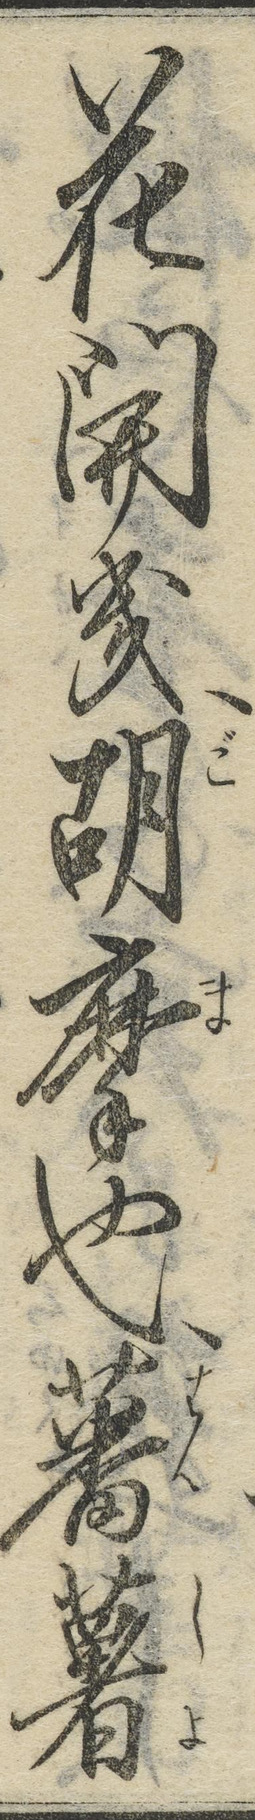花開き、胡摩や、蕃薯
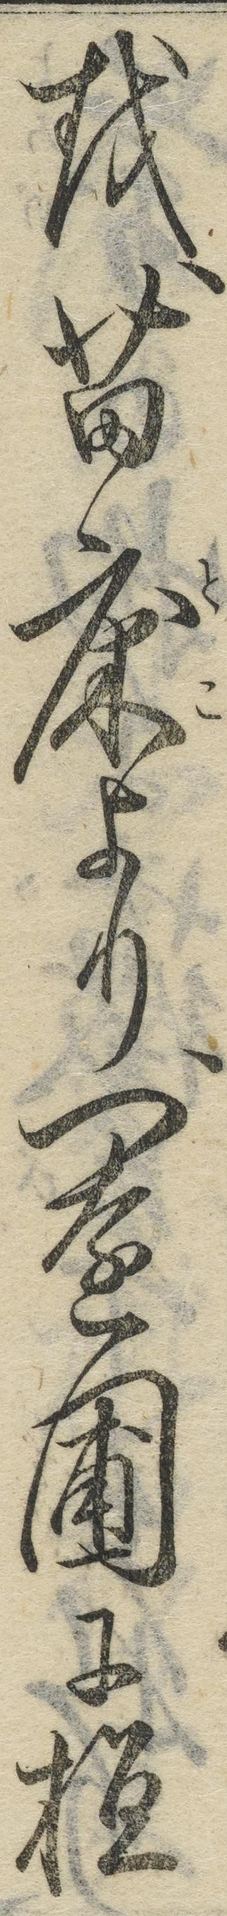を、苗床より、晝圃に植
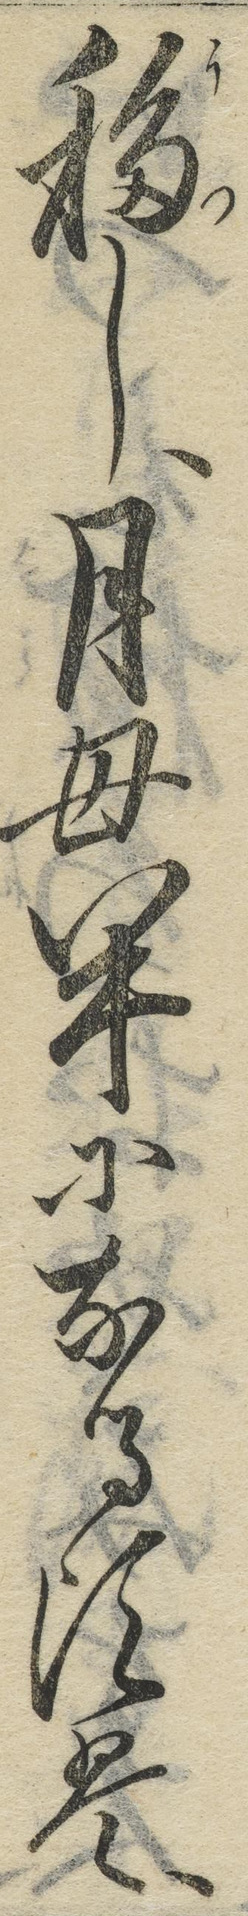移し、月も半になる頃は、

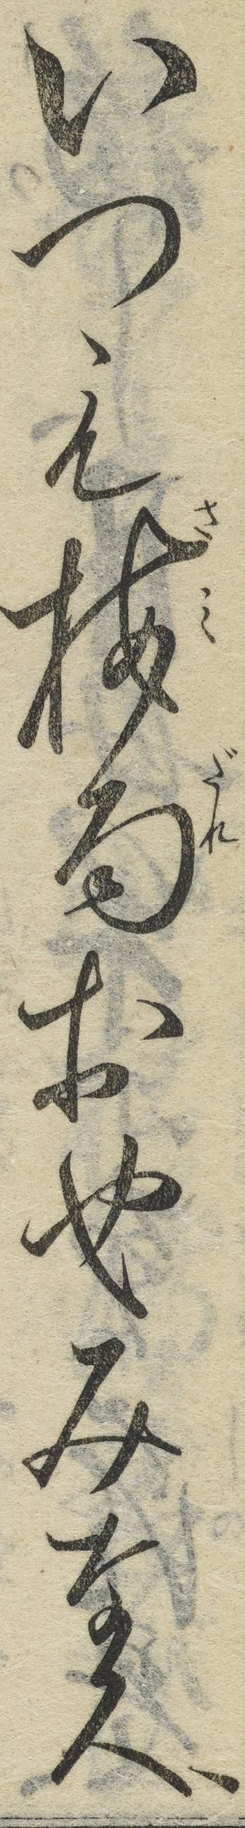いつも梅雨おやみなく、
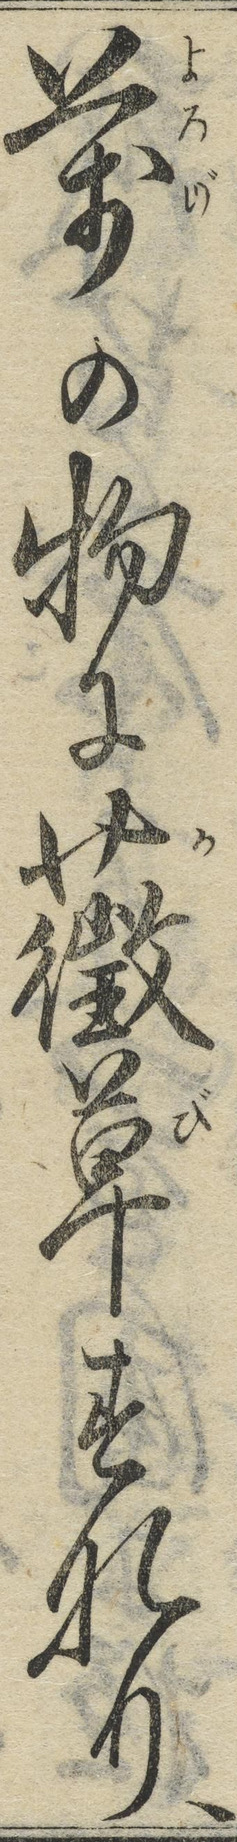万の物に黴草すなり、
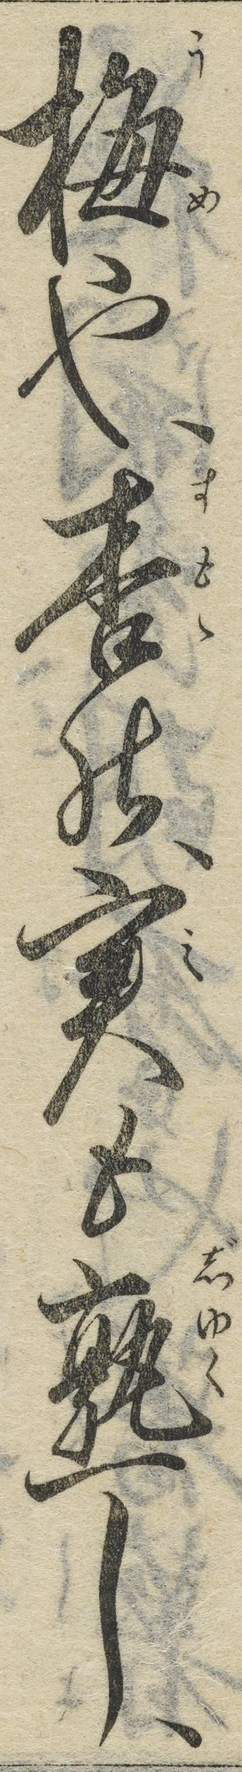梅や、杏の、実も熟し、
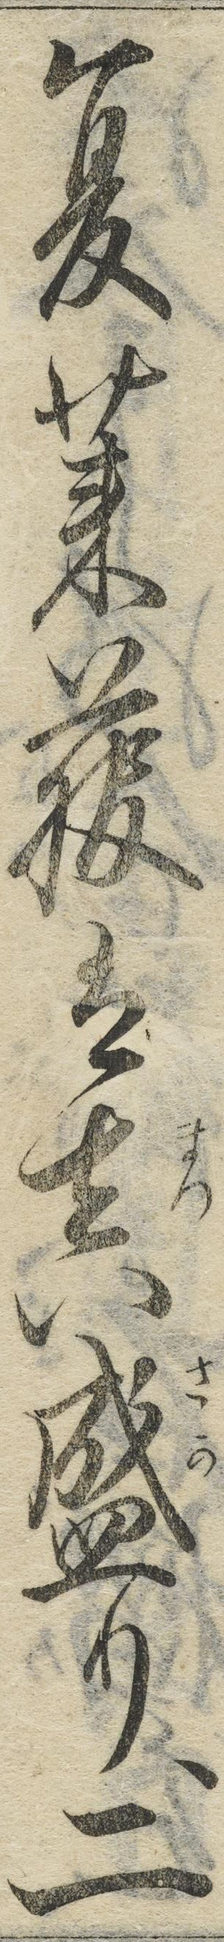夏莱菔は真盛り、二
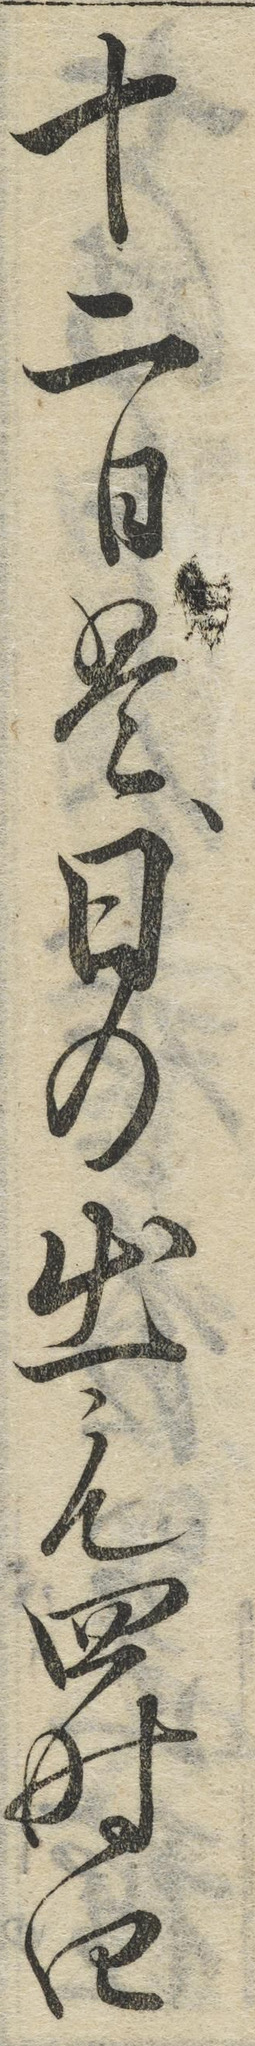十二日は、日の出も四時四
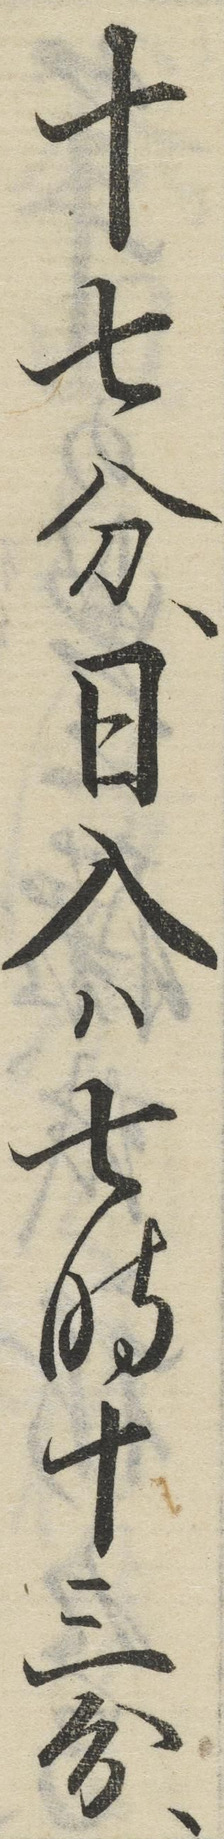十七分、日入は七時十三分、
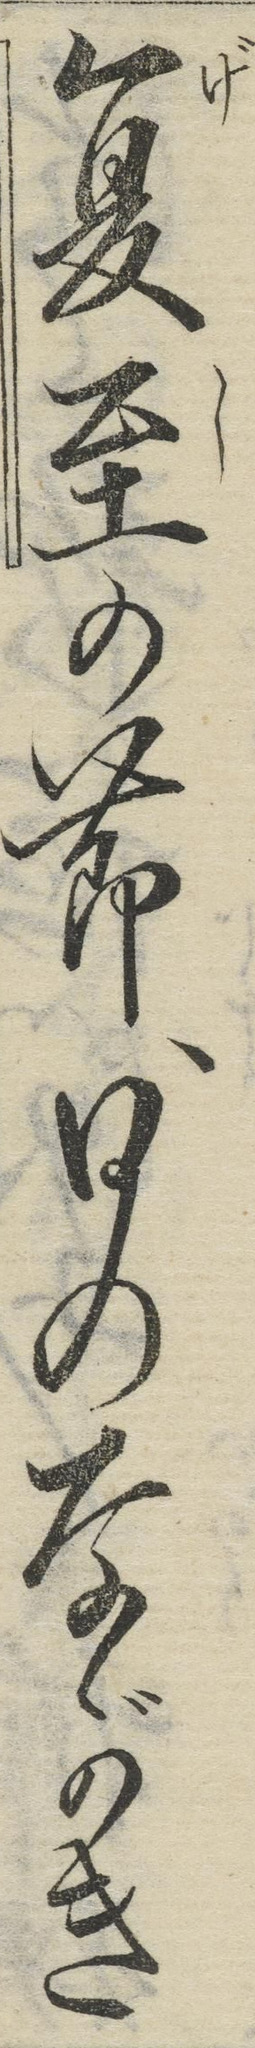夏至の節、日のながき
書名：暦日往来　單
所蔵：東京大学地震研究所図書室 Earthquake Research Institute Library, The University of Tokyo, JAPAN
